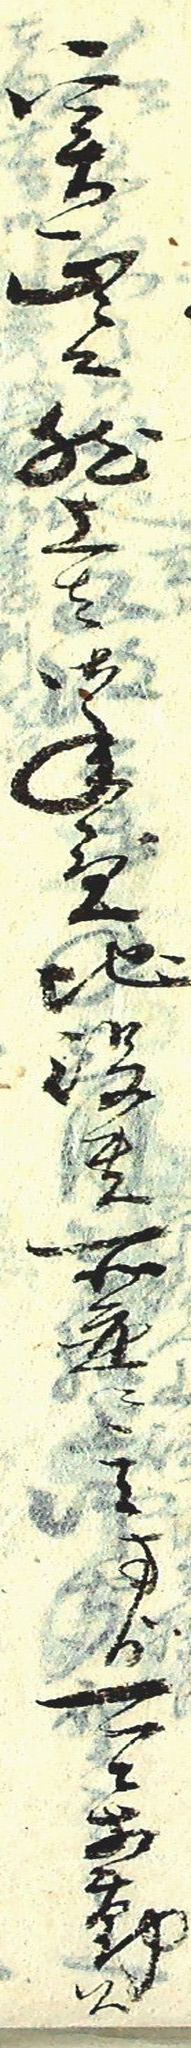実正に候然上は御年貢地役共所並に其方ゟ可被相勤候
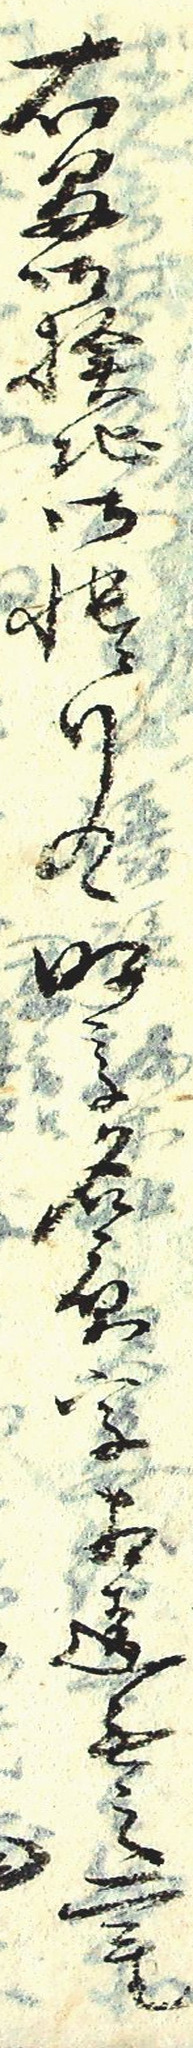右畠御検地御帳に引合畝高名負字相違無之二重
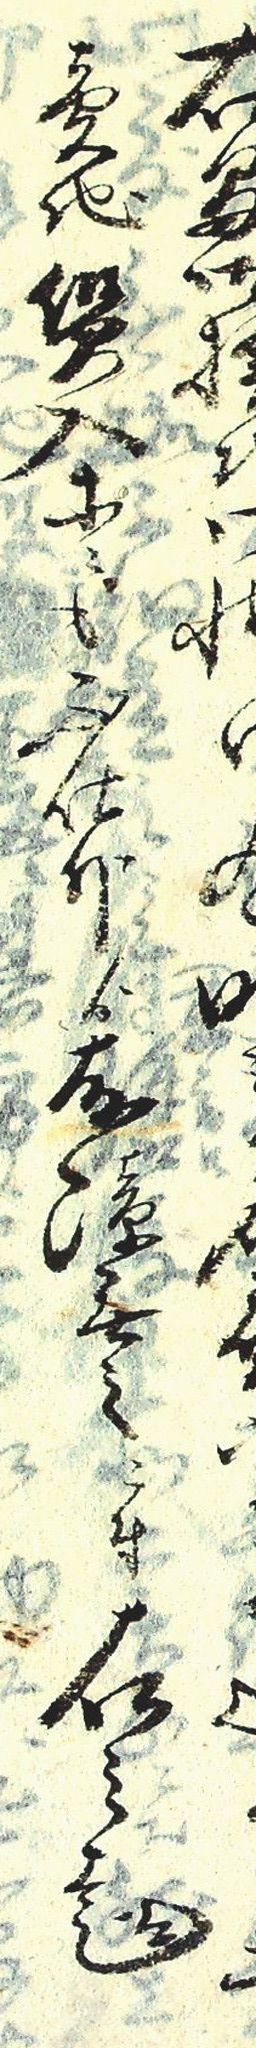売地質入等にも不仕外ゟ故障無之に付右之趣
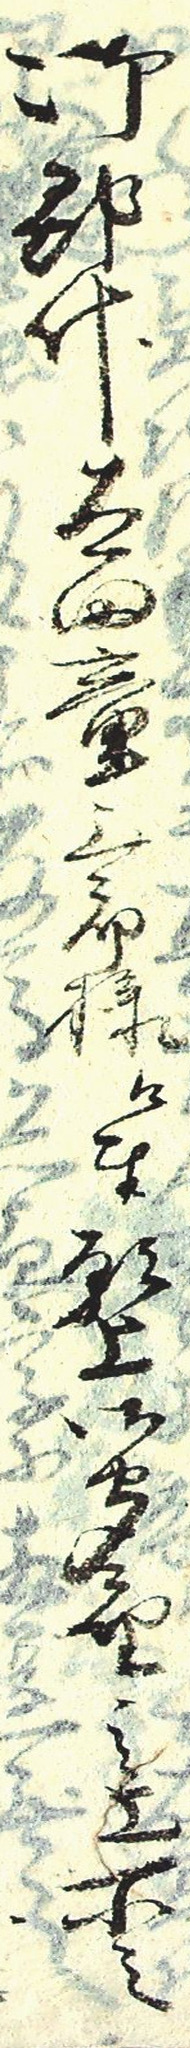御郡代太田童三郎様え奉願上御聞届之上所之
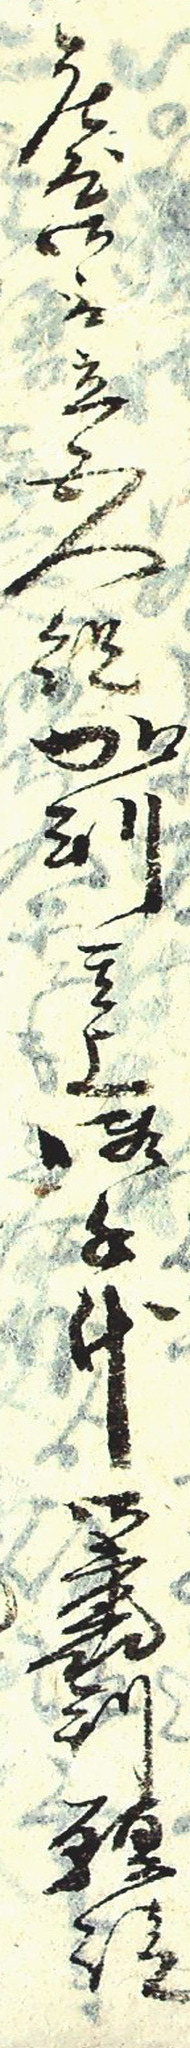庄屋御取立五人組加判其上御手代御裏判願請
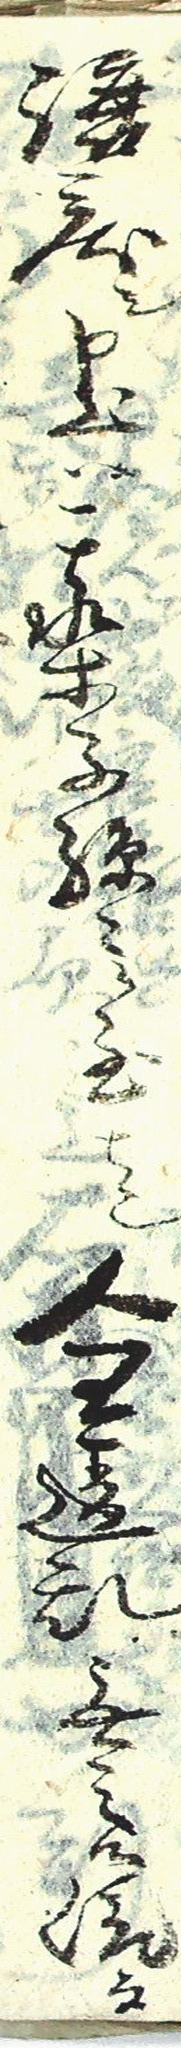譲戻し申上は我等子孫々に至迄全違乱無之候依て
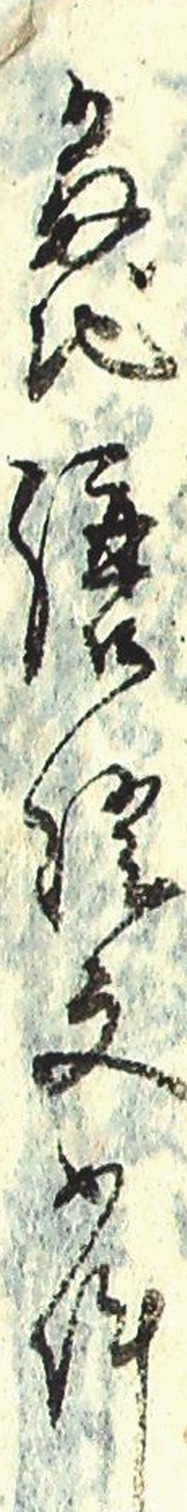畠地譲証文如件

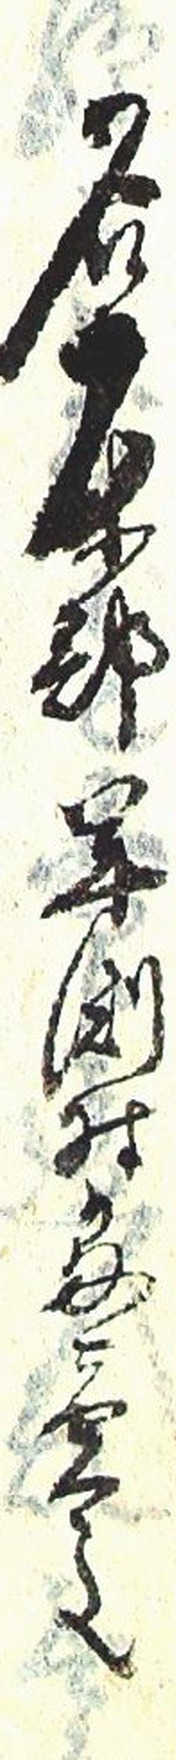名東郡早淵村畠売主
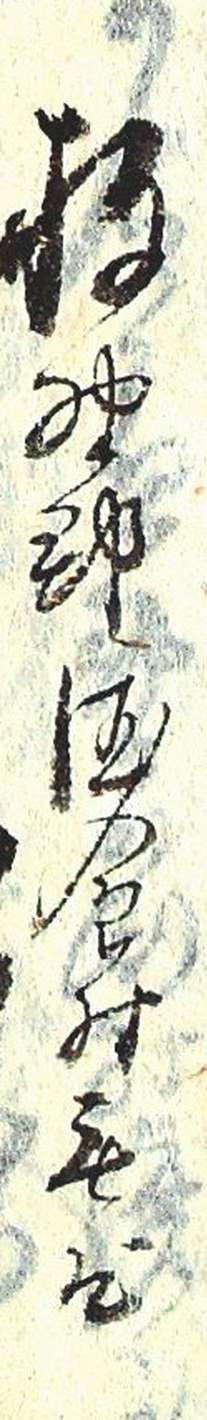板野郡徳命村庄屋
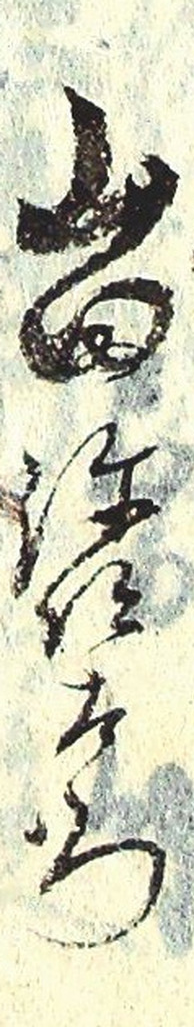山田弥次右衛門
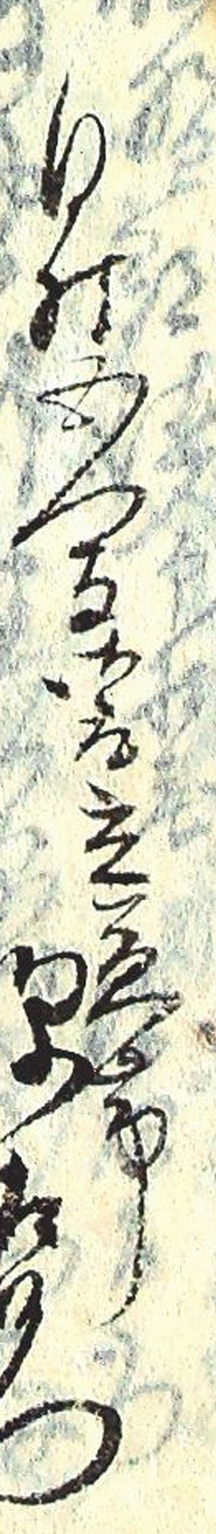同村五人与御取立兼帯
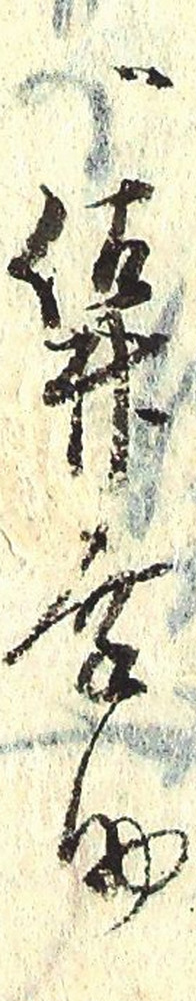同佐井幸助
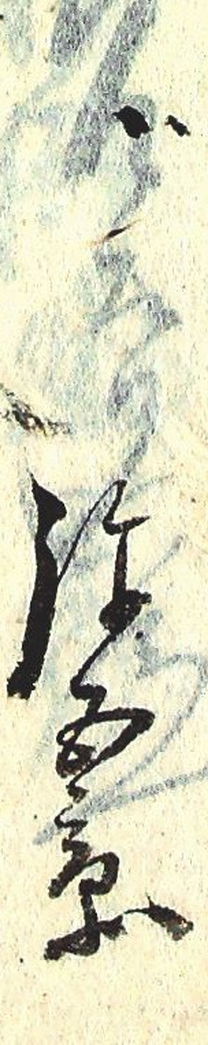同弥五兵衛
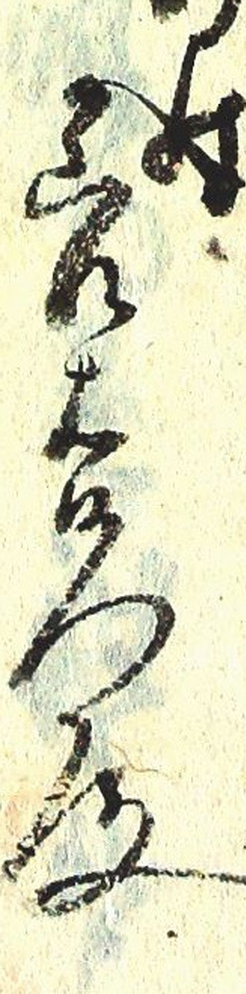善右衛門殿
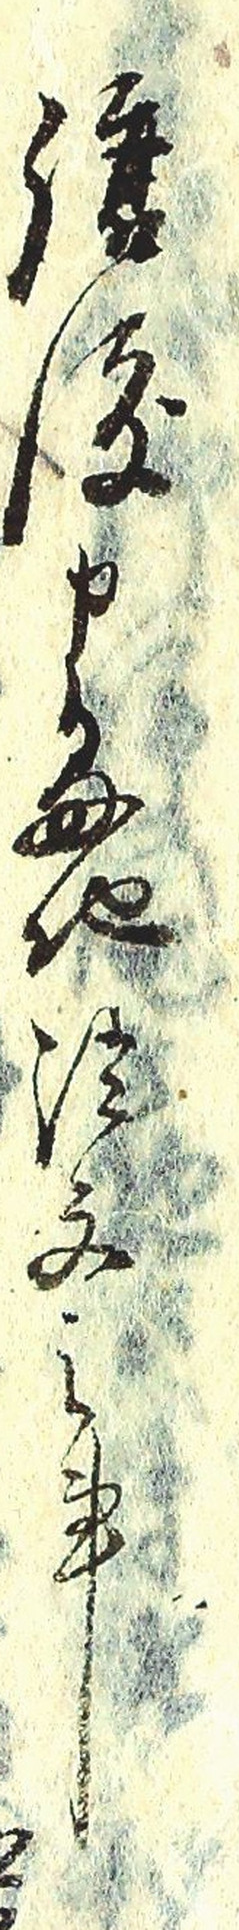譲渡申畠地証文之事
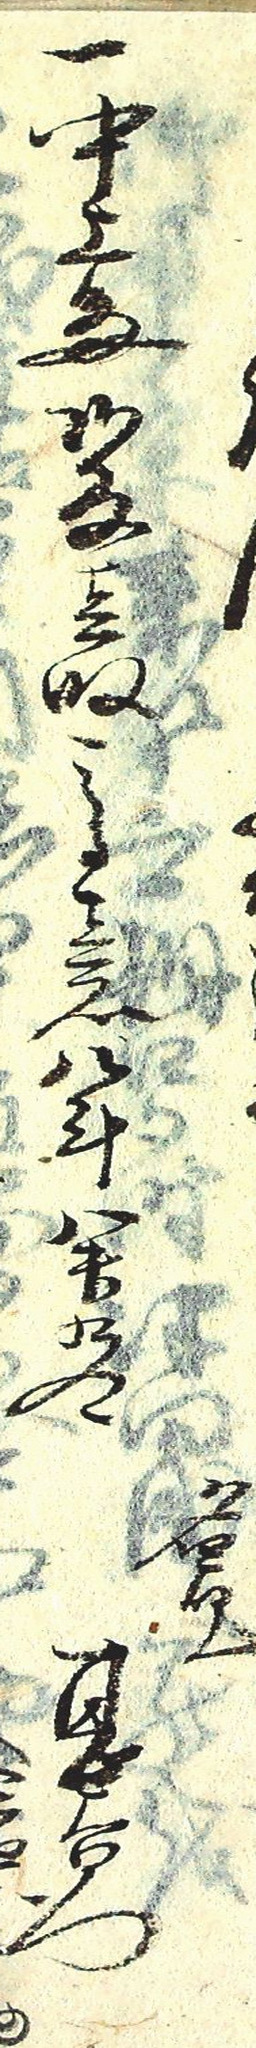一中上畠弐反壱畝高壱石八斗八升九合甚右衛門
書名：諸御願書控(弐番）
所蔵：鳴門教育大学 Naruto University of Education
